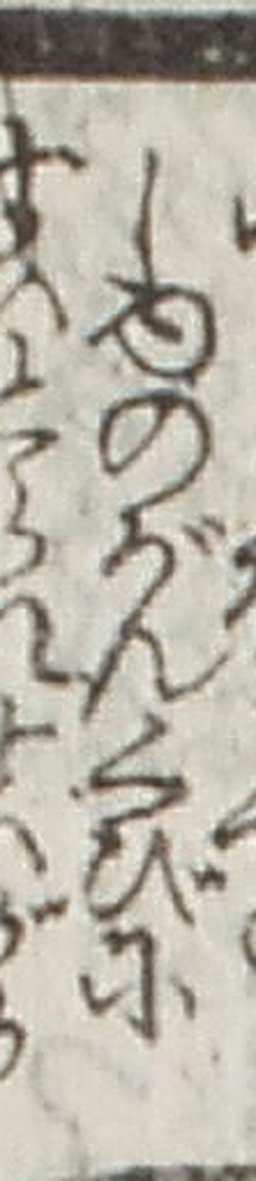すいとられすいがら
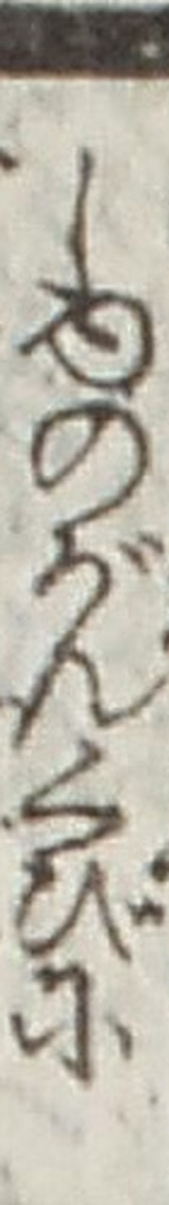しゆのがんくびに
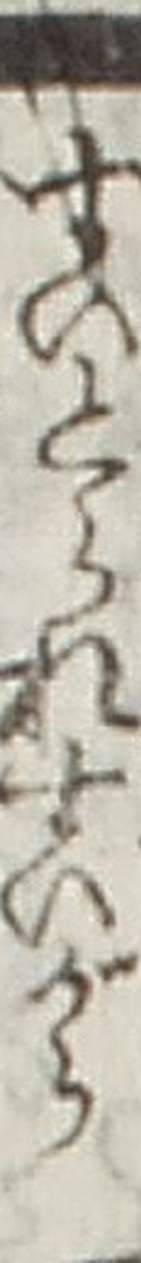すいとられすいがら
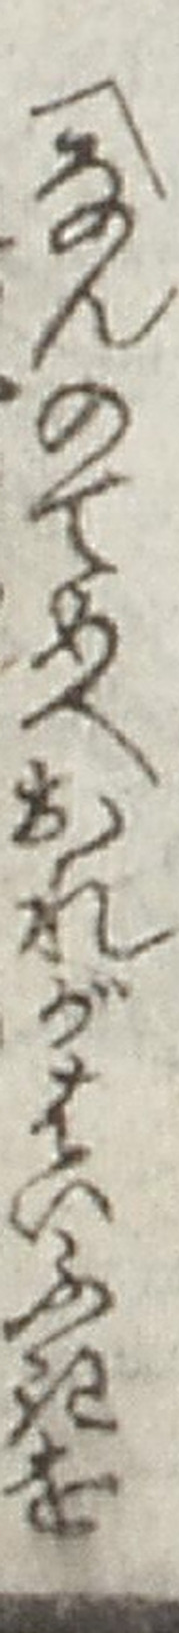〽なんのてめへおれがはいふきを
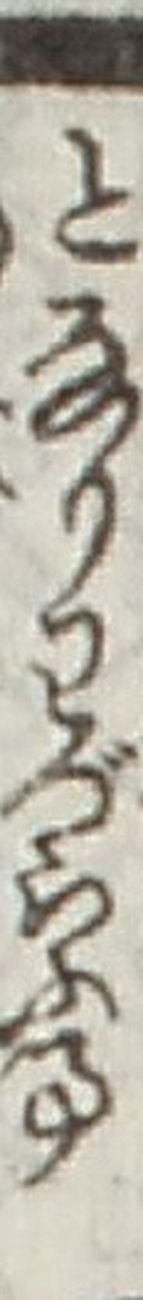となりわづらふ事
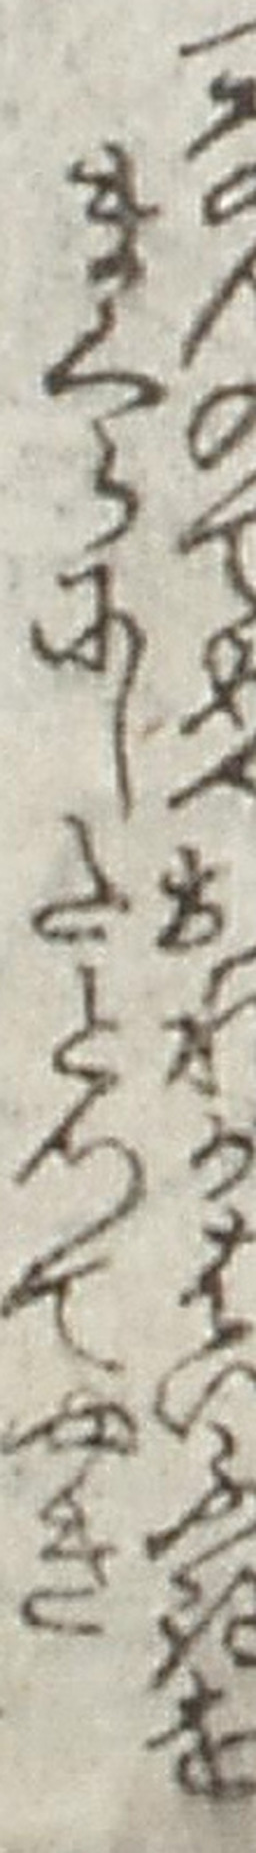まくらにしたとつてやき
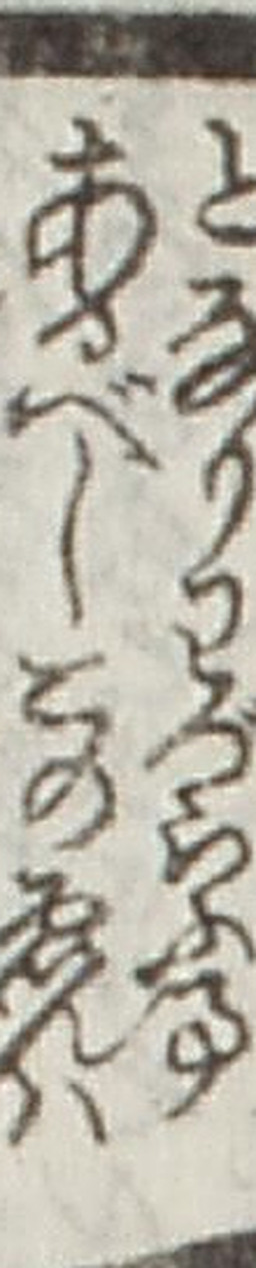あるべしとのゑんは
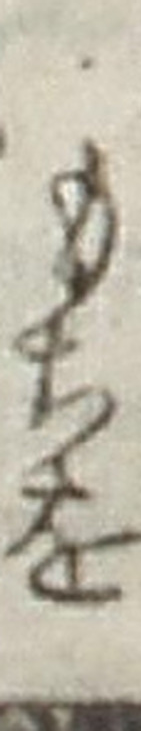もちを
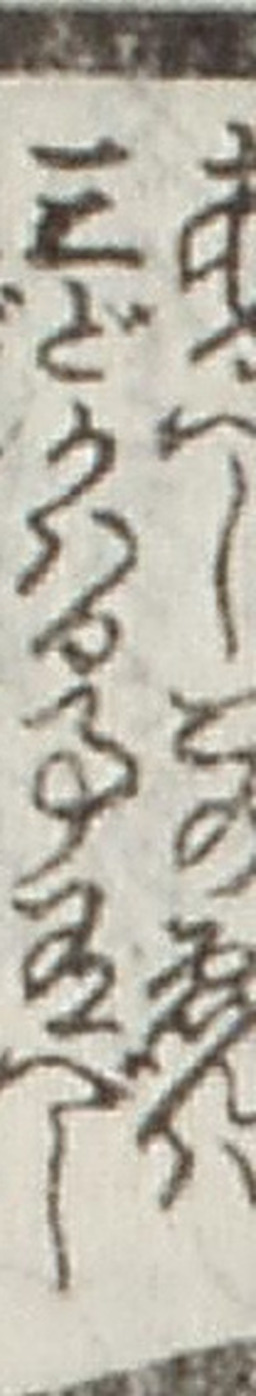三どかはる事有べし
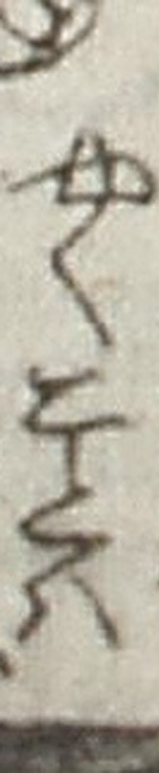やくことは
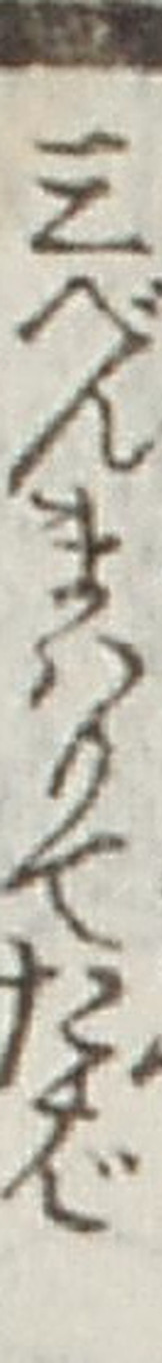三べんまはりてたば
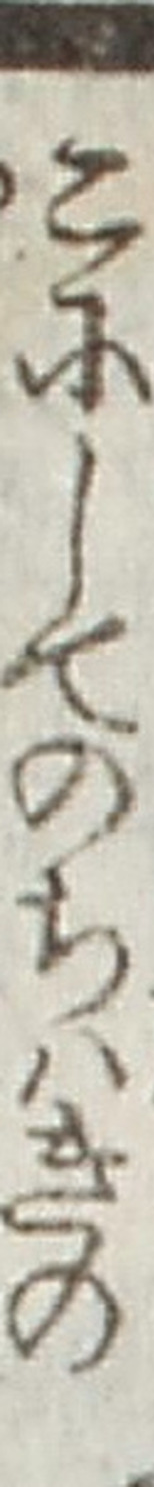こにしてのちはきの
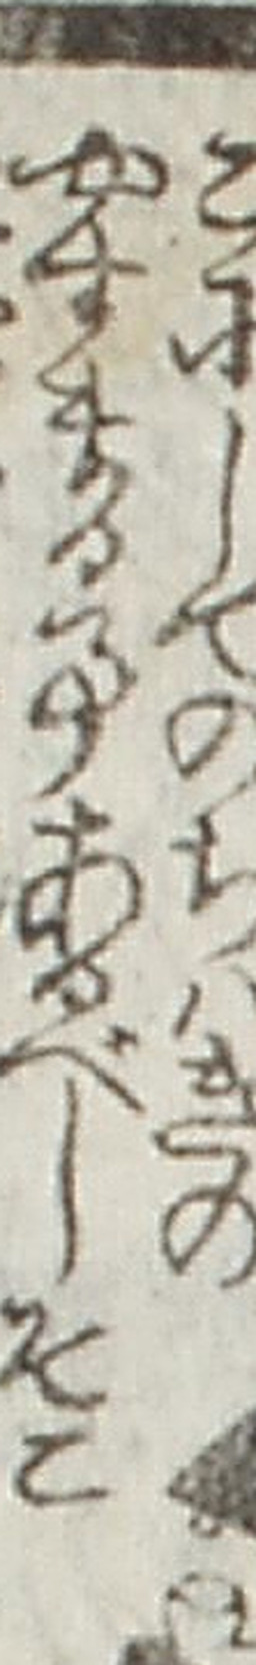やすまる事あるべしそこ
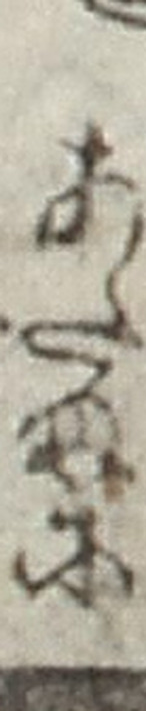あたまに
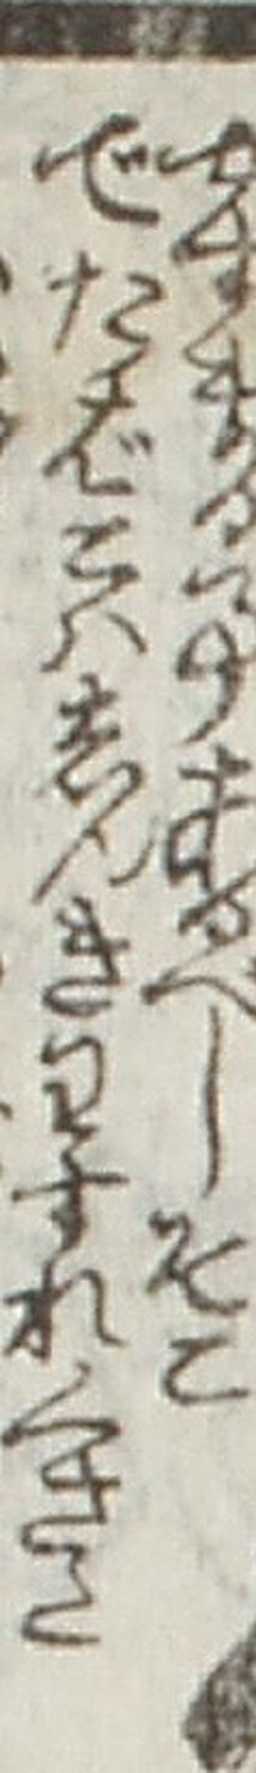でたばこはしんきわすれくさと
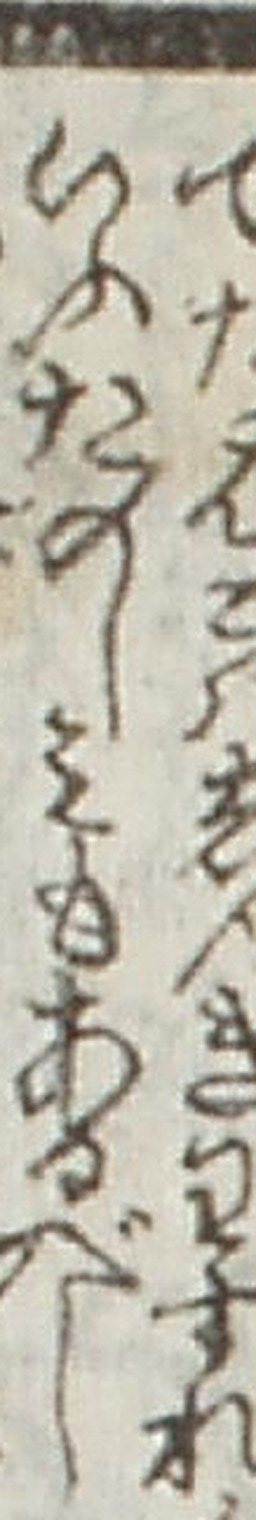いふたのしみもあるべし
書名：三世相出雲當座帳　上下冊
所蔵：東京大学地震研究所図書室 Earthquake Research Institute Library, The University of Tokyo, JAPAN
